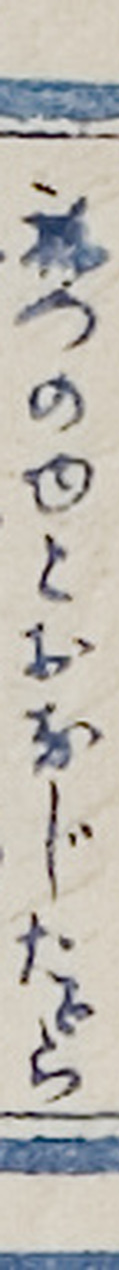ねつのゆとおなじたら
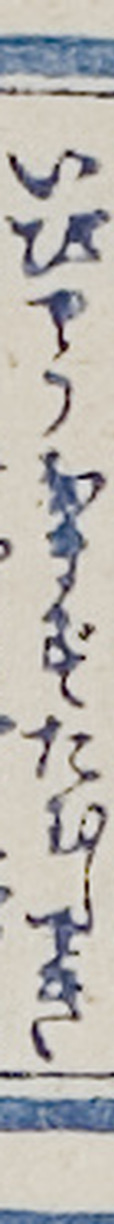いびやうなまずたむしでき
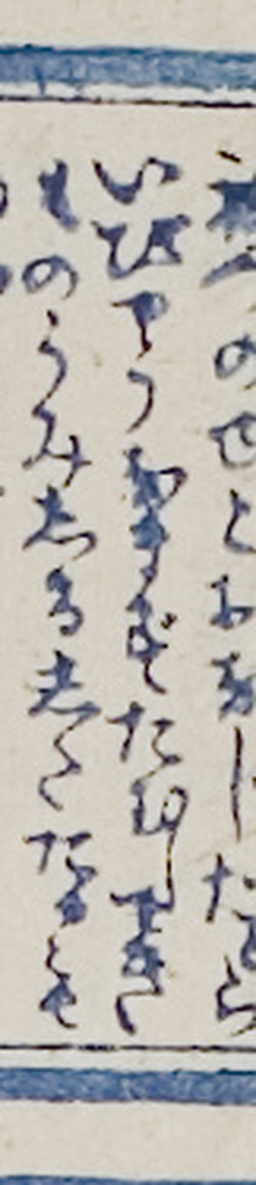ものうみしるしたたかも
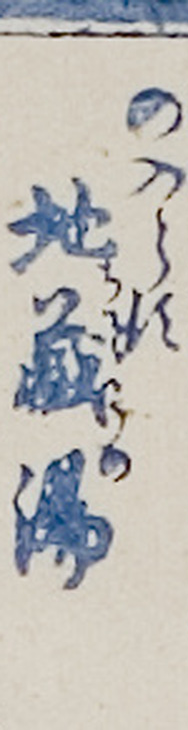地蔵湯
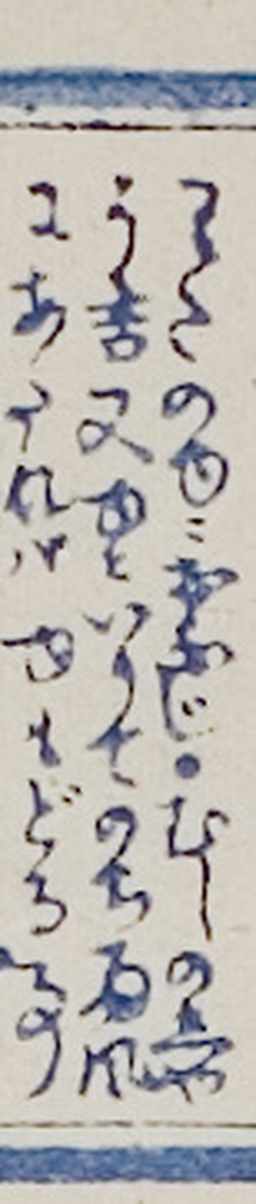にあたればもどる事
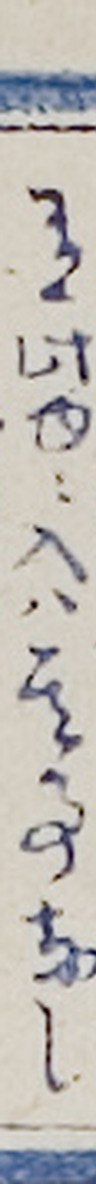此つに入は其事なし
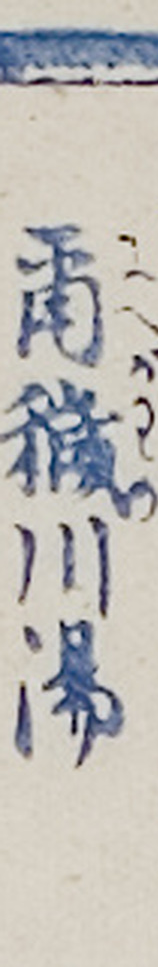爾穢川湯
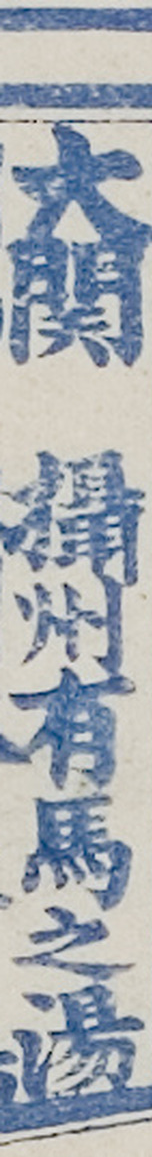大関摂州有馬之湯
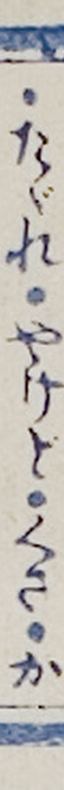・たゞれ・やけと・くさ・か
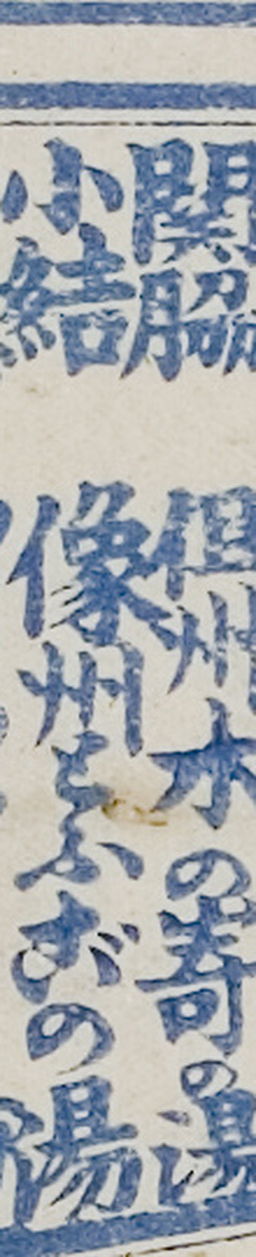小結予州とふごの湯
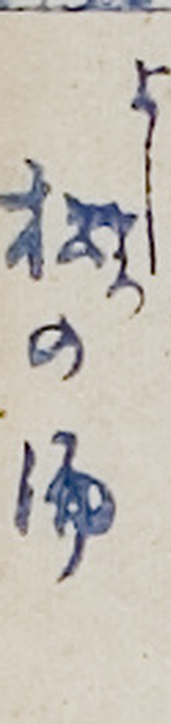松の湯
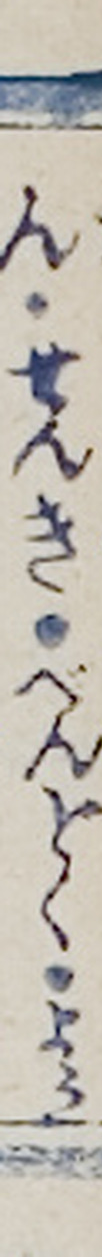ん・せんき・べんどく・よう
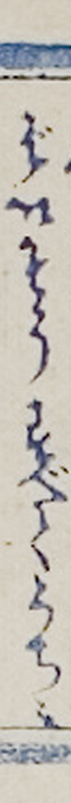ばいそうすべてうちみ
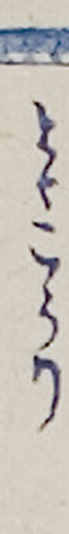とゝこうり
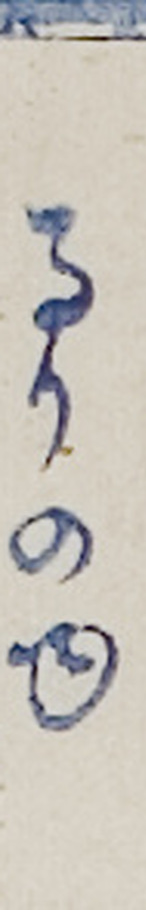るりのゆ
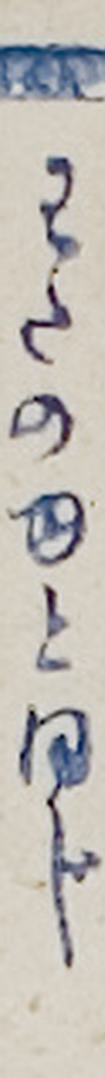わたのゆと同じ
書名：諸国温泉鑑 上州草津温泉図
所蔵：東京大学総合図書館 General Library in the University of Tokyo, JAPAN
